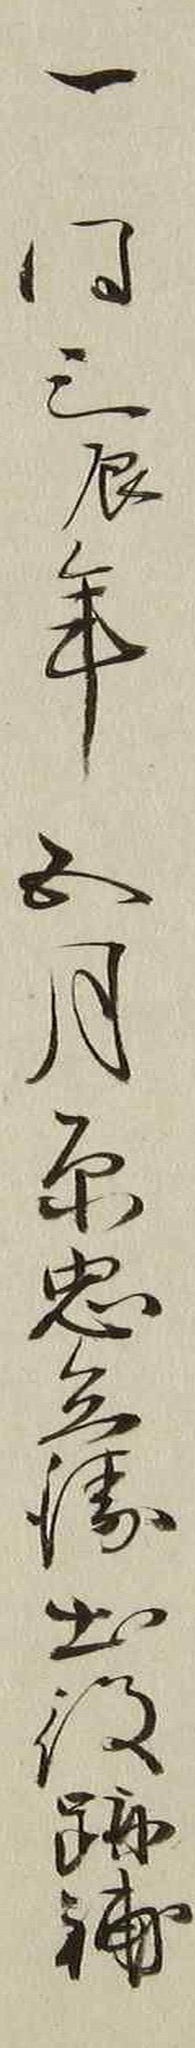一同三辰年五月原忠兵衛出役跡補
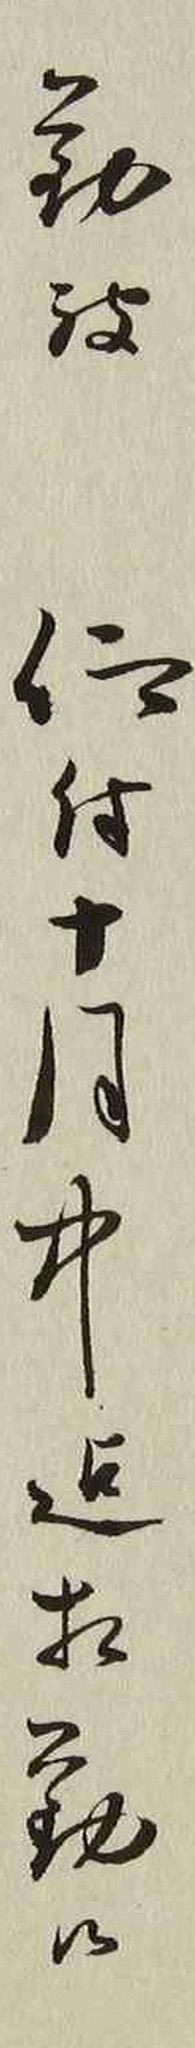勤被仰付十月中迄相勤候
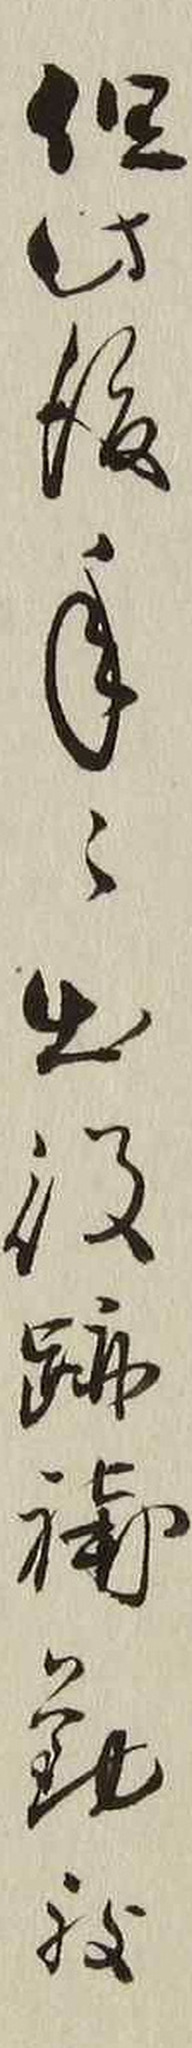但此後年々出役跡補勤被
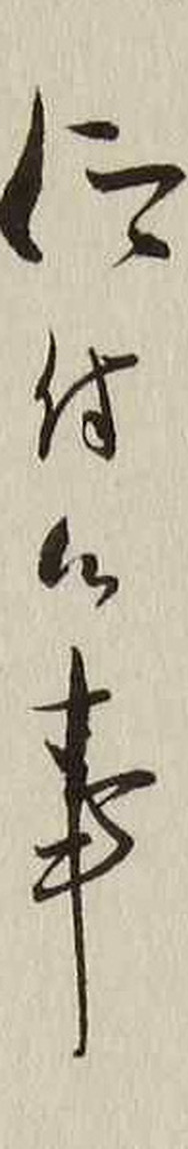仰付候事
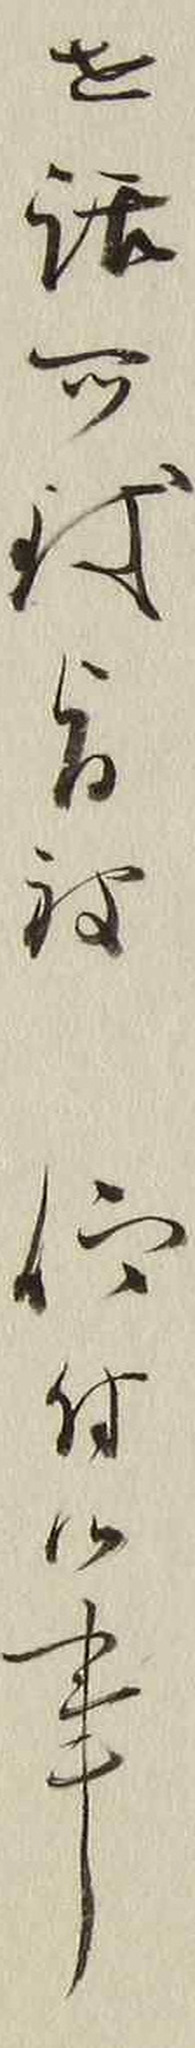世話可致旨被仰付候事
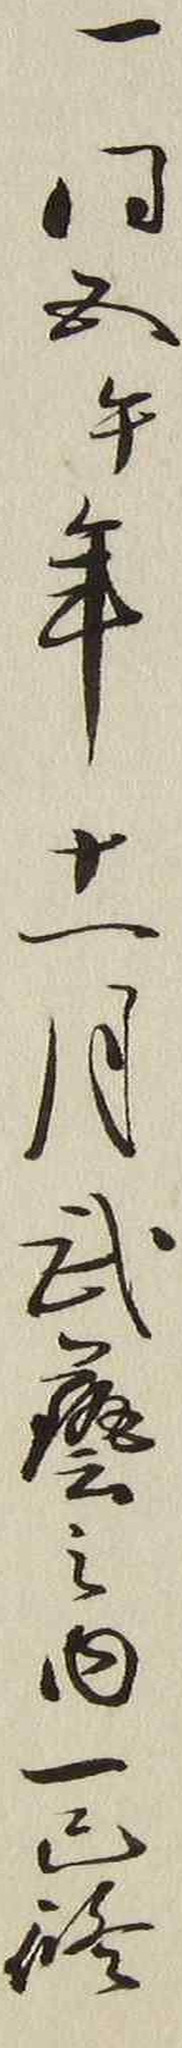一同五午年十一月武芸之内一己修
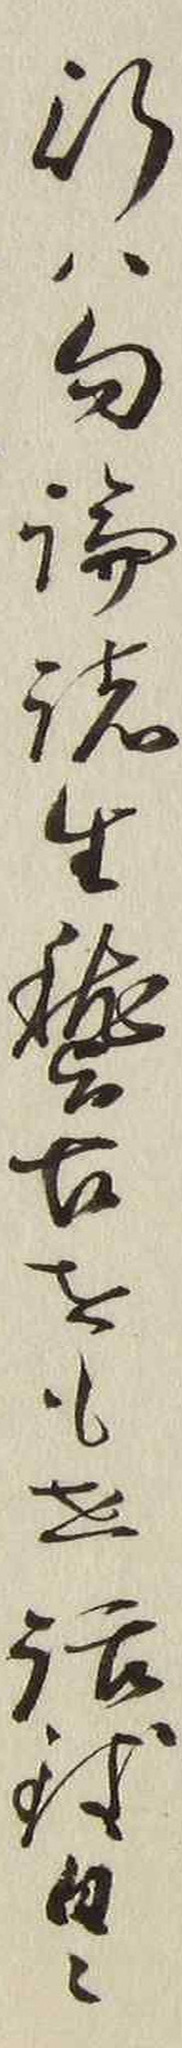行は勿論諸生稽古をも世話致日々
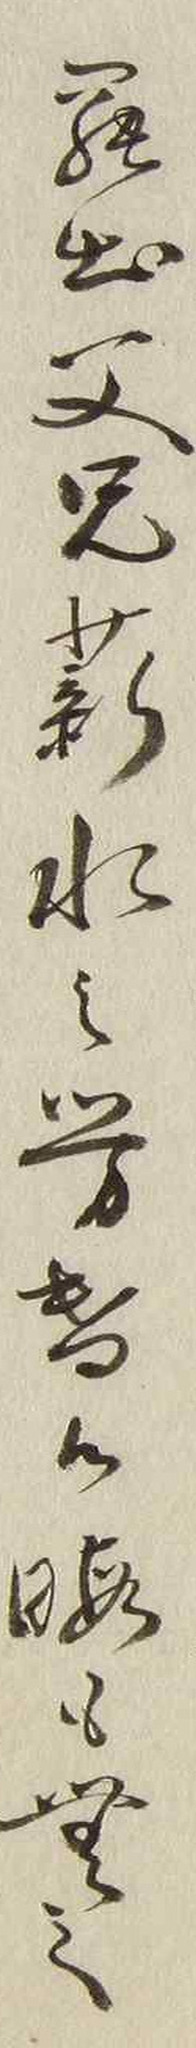罷出父兄薪水之労替候暇も無之
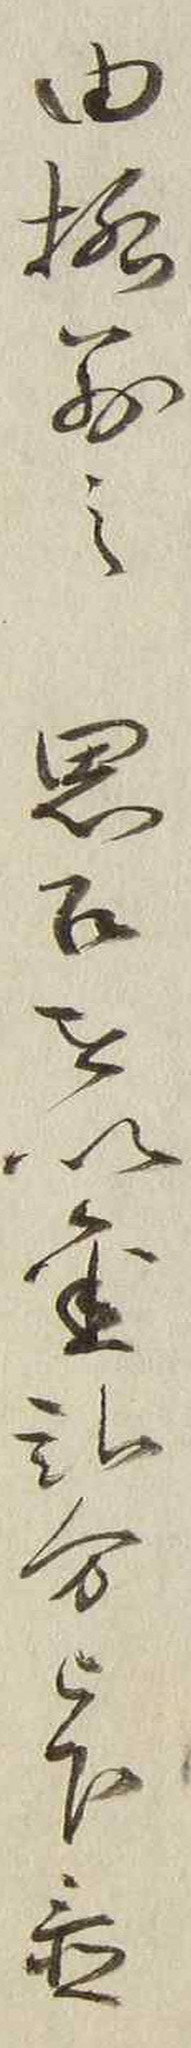由格別之思召を以金弐分被下置

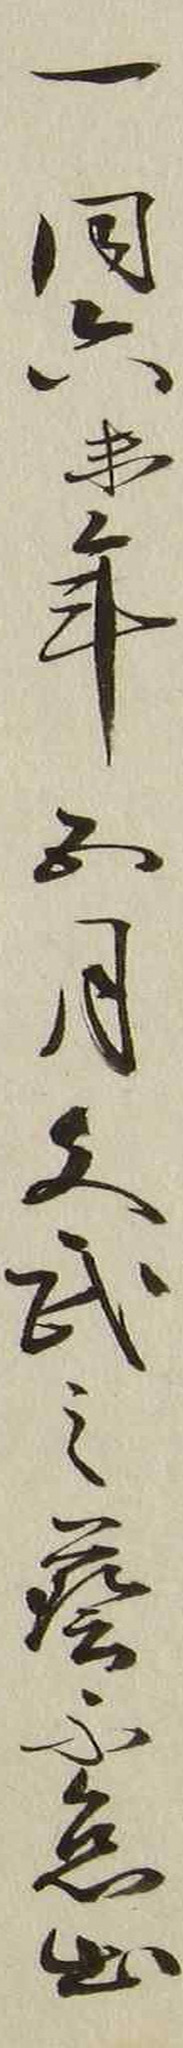一同六未年五月文武之芸不怠出
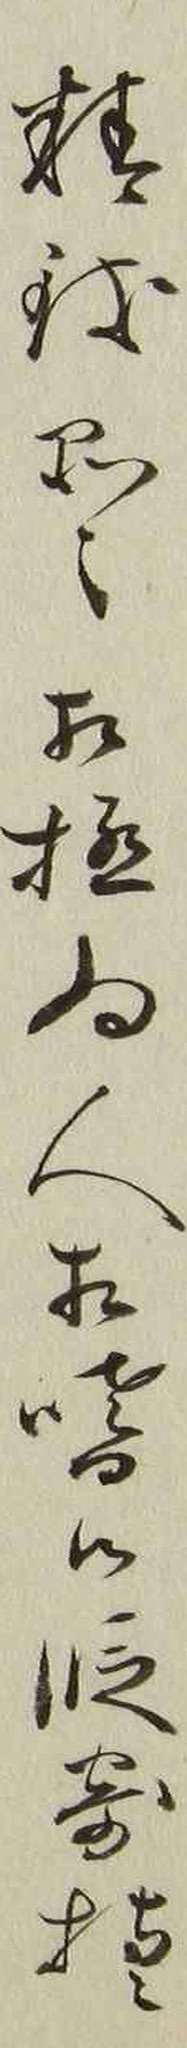精致品々相極為人相嗜候段寄特ニ
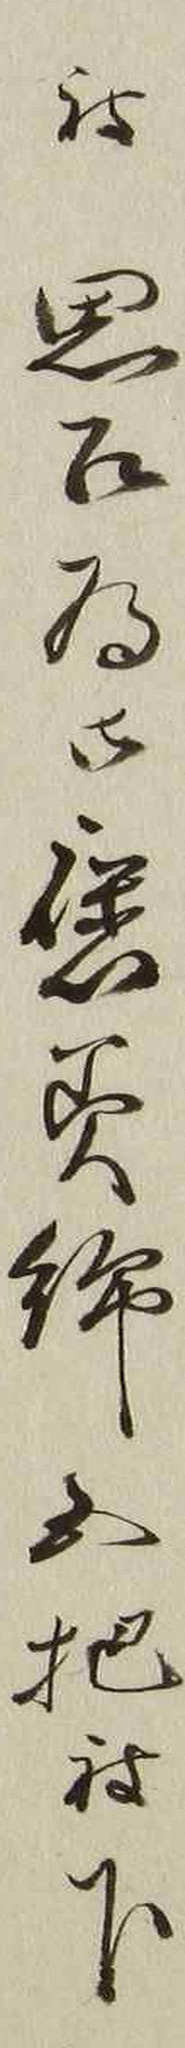被思召為御褒美綿五把被下
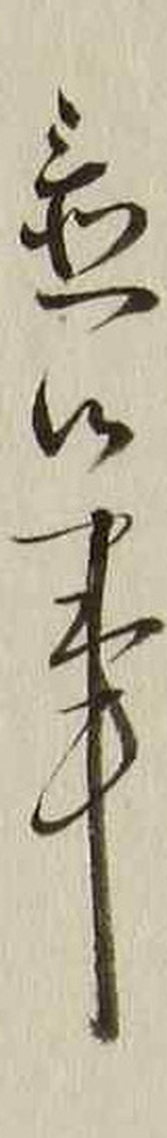置候事
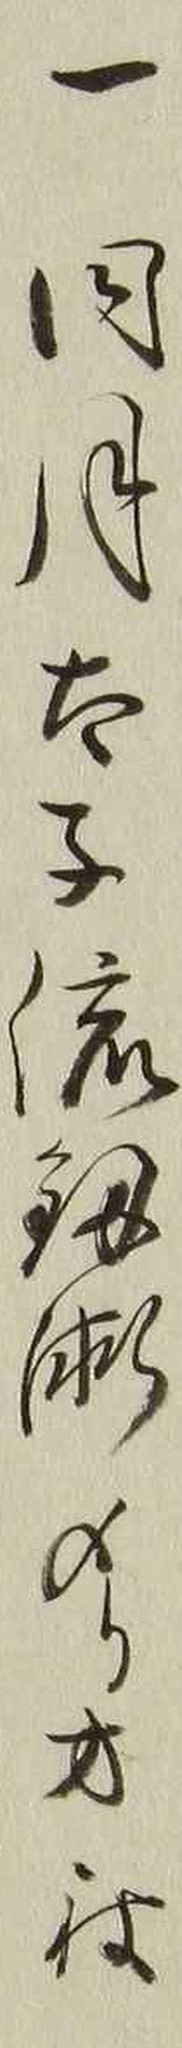一同月太子流剣術〆り方被
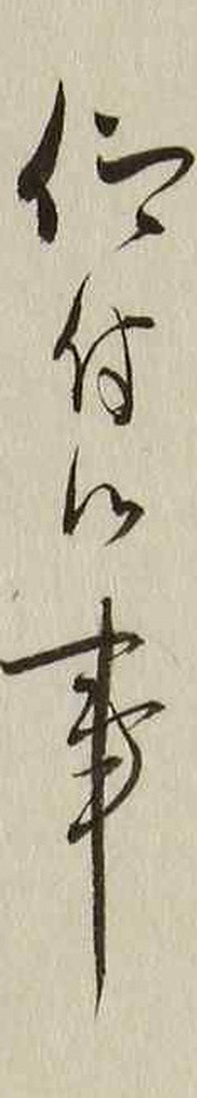仰付候事
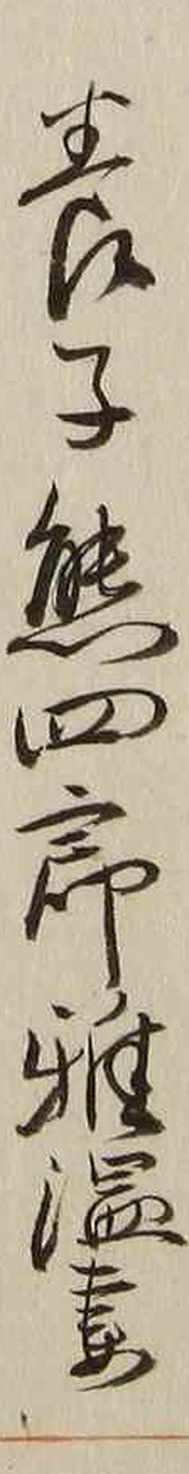女養子熊四郎雅温妻
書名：諸士系譜　巻之163　な之部5
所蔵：会津若松市立会津図書館
